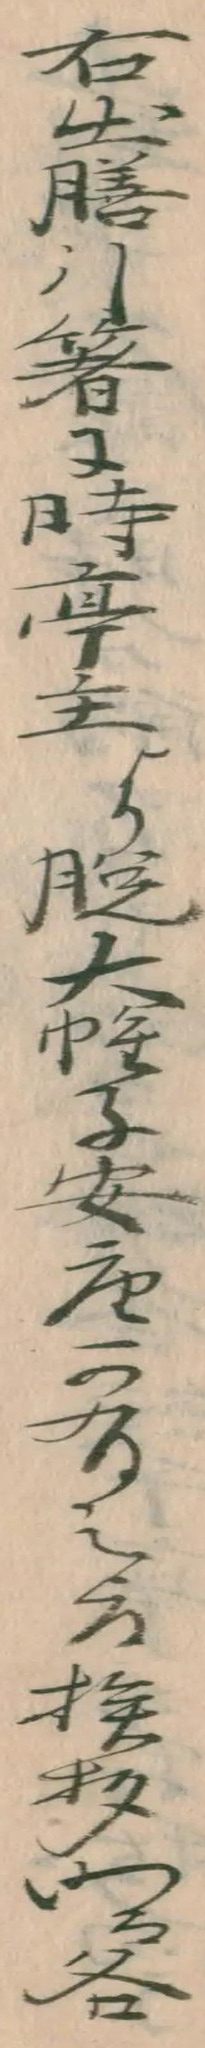右出膳引簪于時亭主より脱大帷子安座可有之旨挨拶仍而各
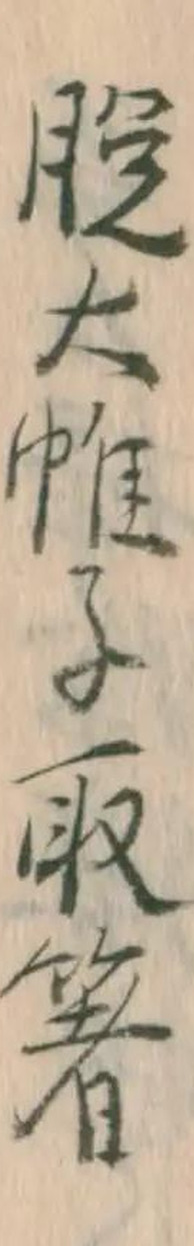脱大帷子取箸
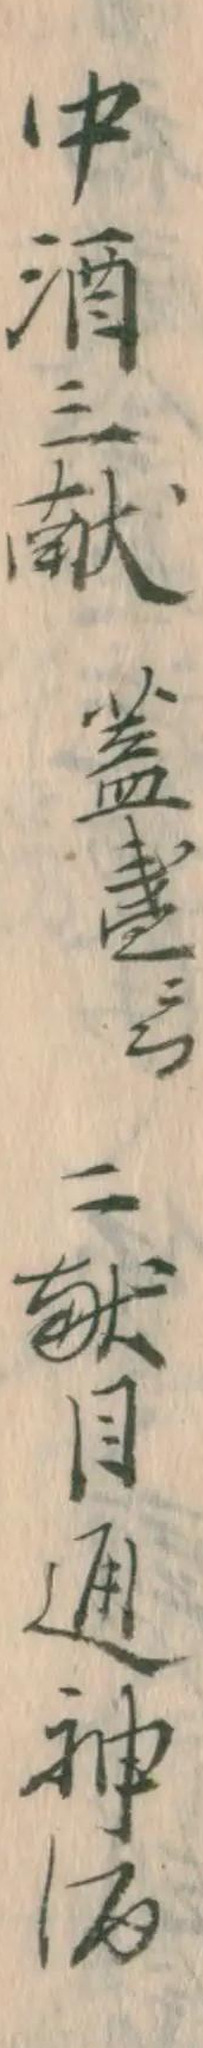中酒三献蓋盞ニ而二献目通神酒
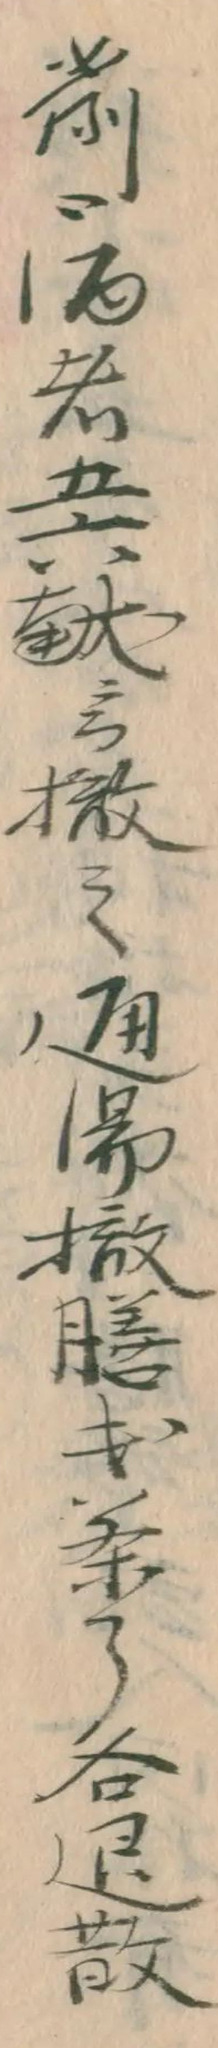如例御酒は五六献ニ而撒之通湯撤膳出茶了各退散

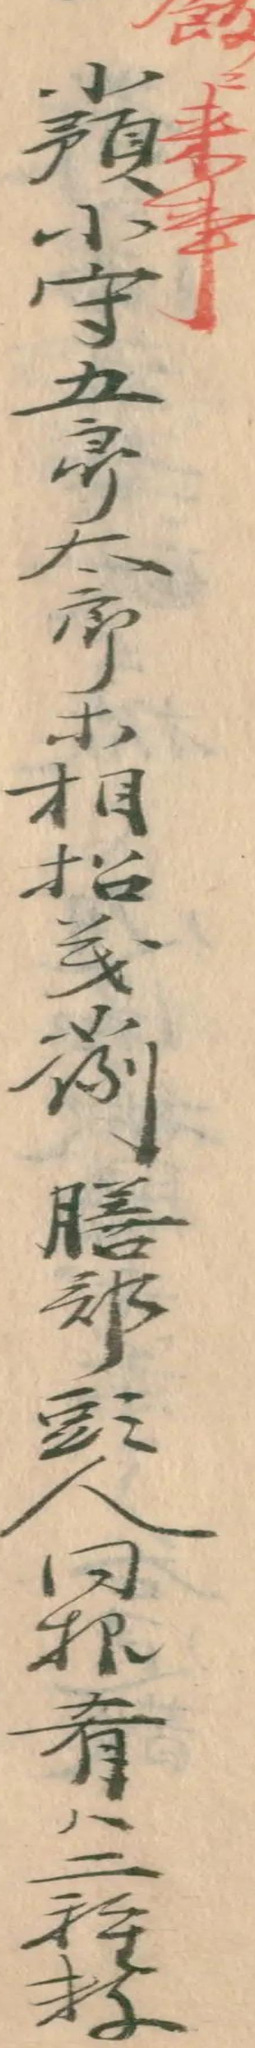一小預小守五郎太郎等相招義如例膳部頭人同様肴ハ二種数
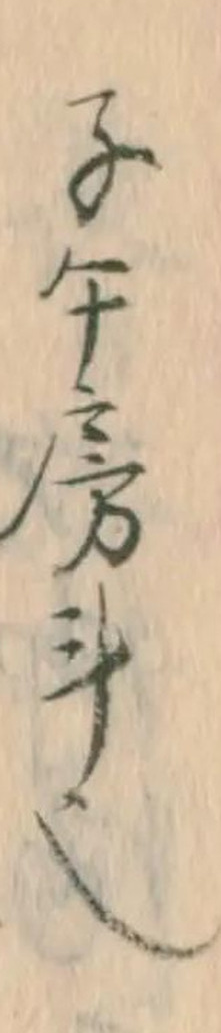子午房斗也
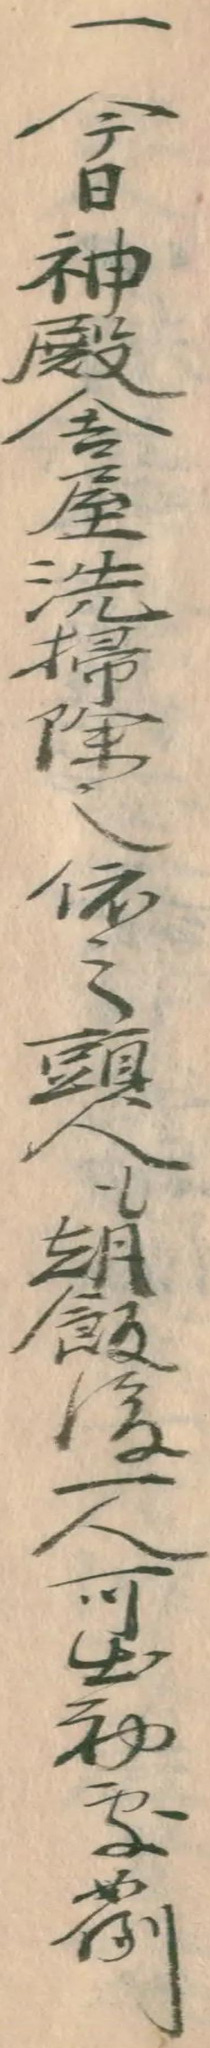一今日神殿舎屋洗掃除也依之頭人も朝飯後一人可出初處如例
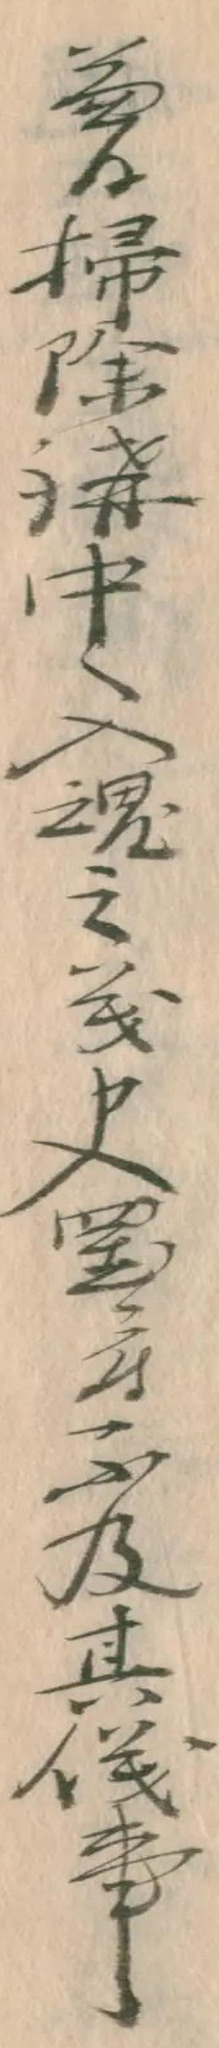兼日掃除講中へ入魂之義申入置ニ付不及其儀事
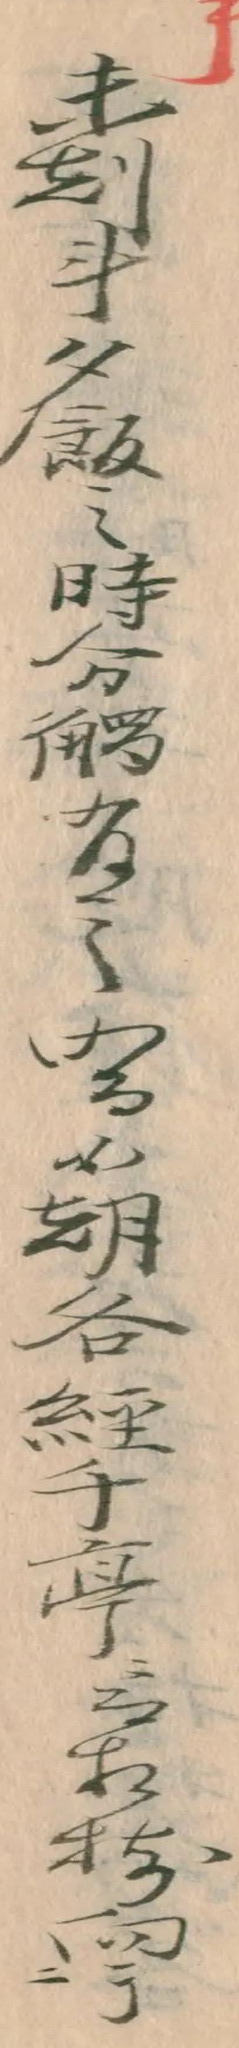一未刻斗夕飯之時分觸有之仍而如朝各経千亭ニ而相持向于
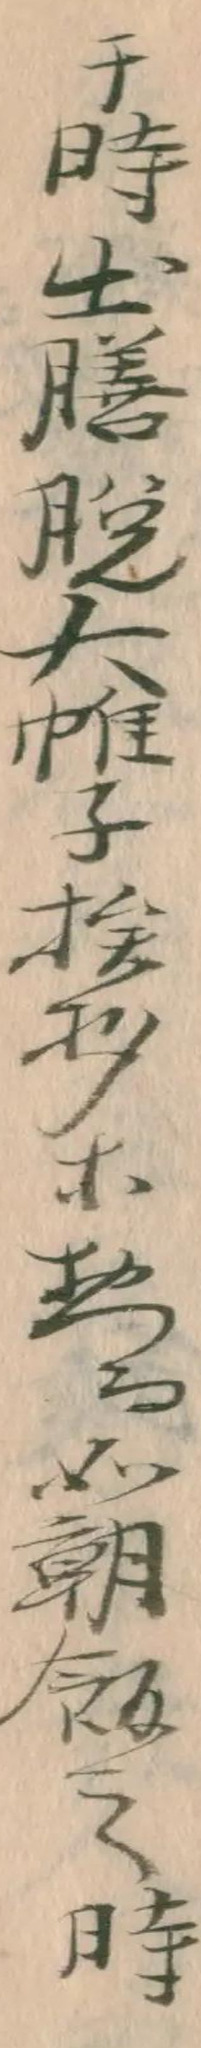于時出膳脱大帷子挨拶等惣而如朝飯之時
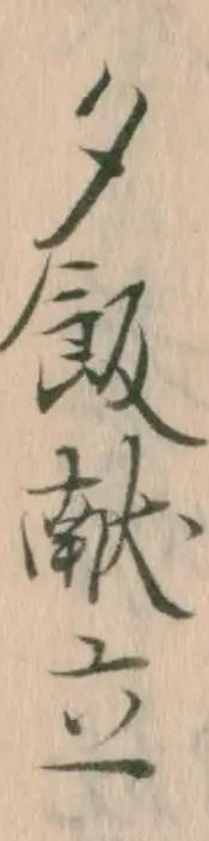夕飯献立
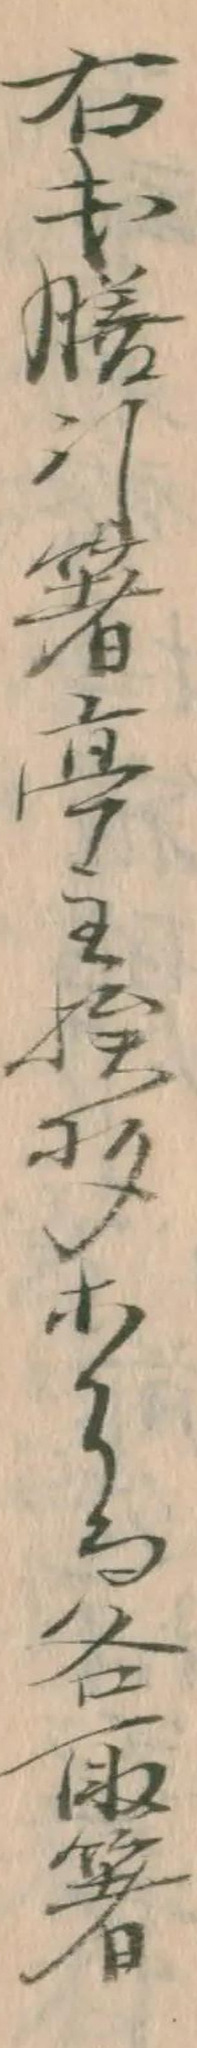右本膳引箸亭主挨拶等了而各取箸
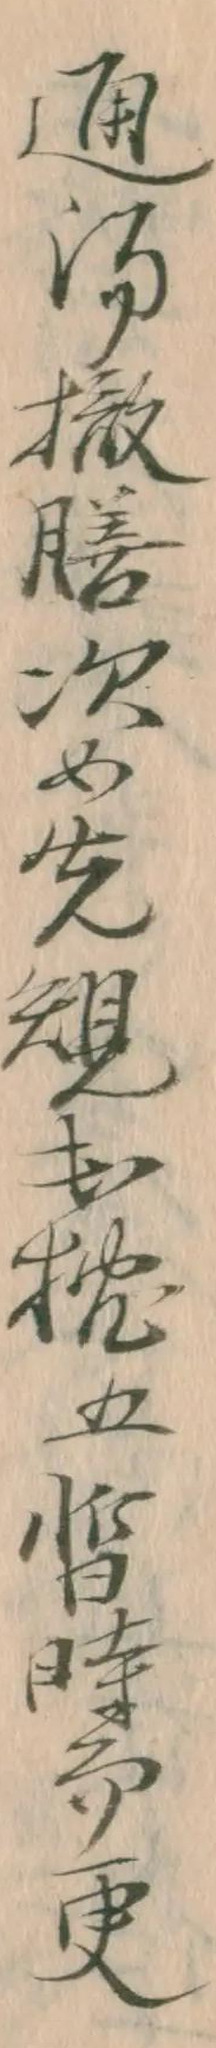通酒撤膳次如先規出枕五暫時而更
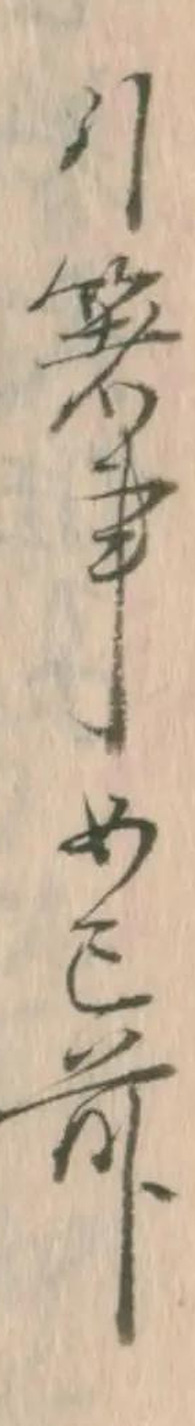引著事如已前

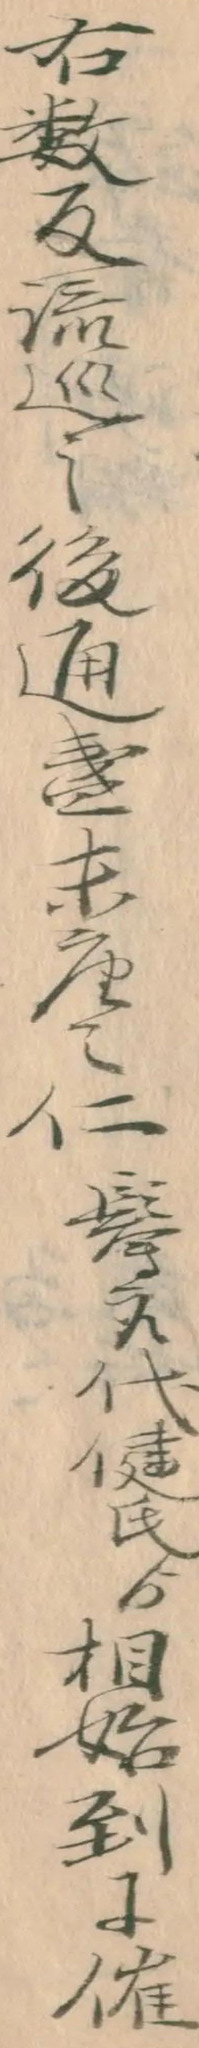右数反流巡之後通盞末座之仁鬠取代健氏ゟ相始到于催
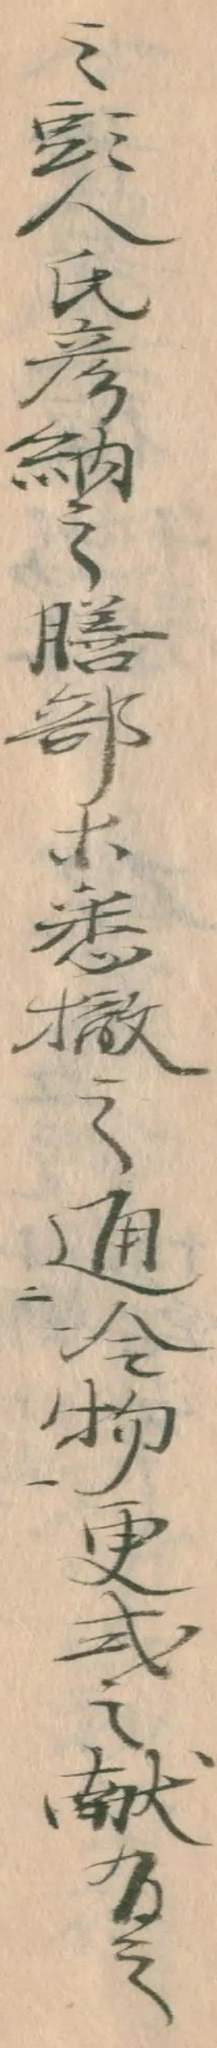之頭人氏彦納之膳部等悉撒之通冷物更式之献有之
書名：賀茂社記録. 第74冊
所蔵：国立国会図書館 National Diet Library, JAPAN
